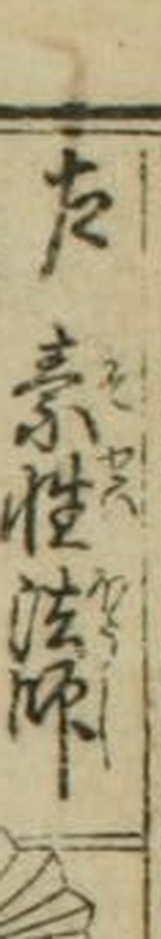左素性法師
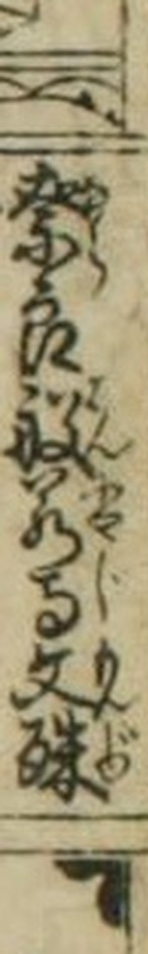奈良般若寺文殊
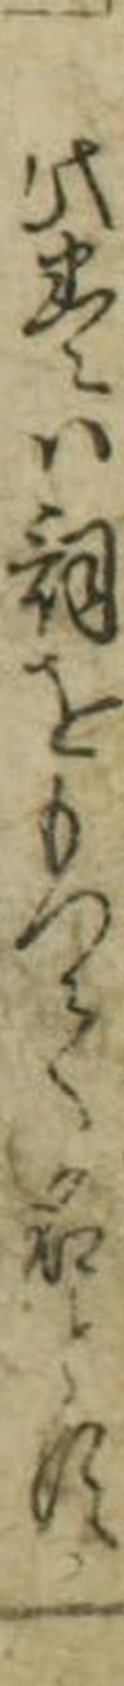此巻は詞をもつて名とす
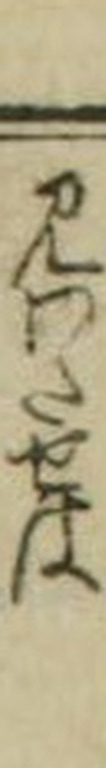見わたせは
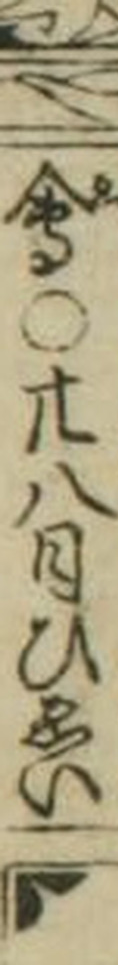会○廿八日ひゑい
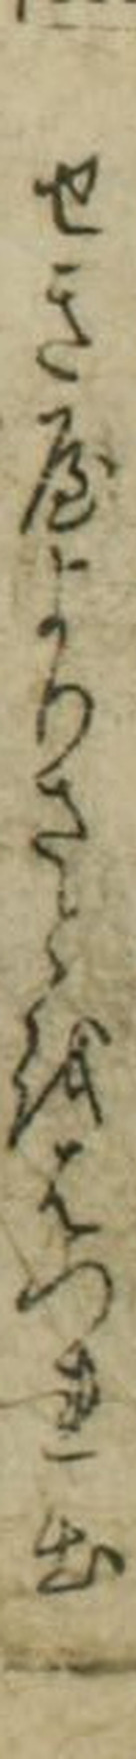せき屋よりさとをはつれ出
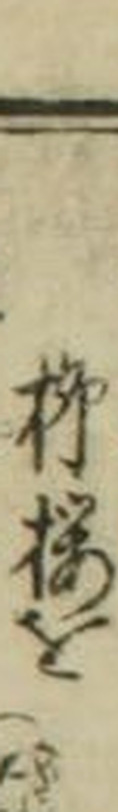柳桜を
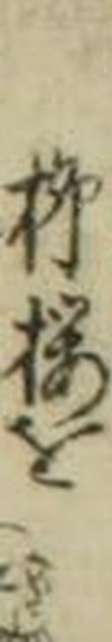柳桜を
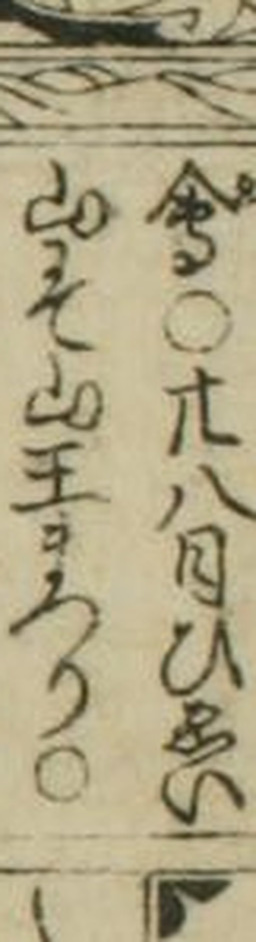山にて山王まつり○
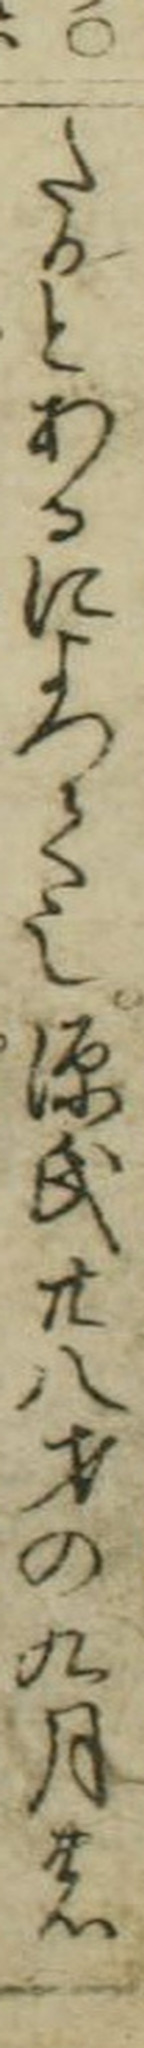たるとあるによつて也。源氏廿八才の九月の
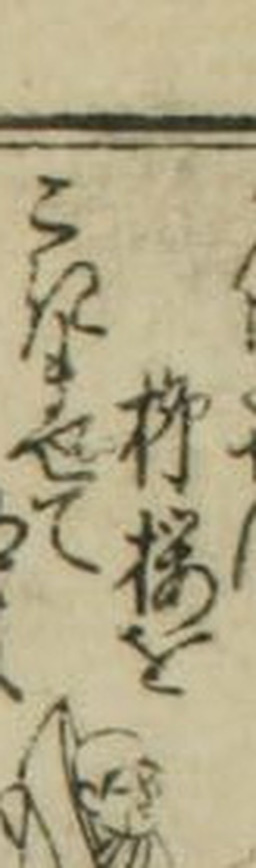こきまぜて
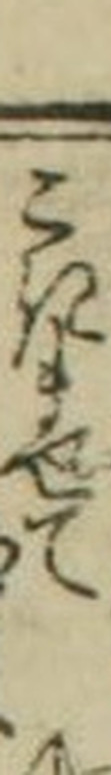こきまぜて
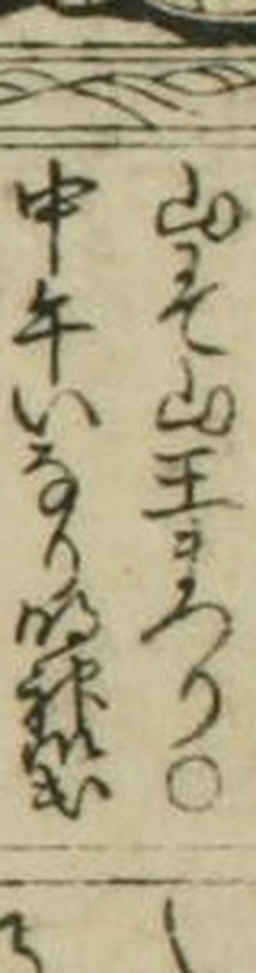中午いなり明神御出
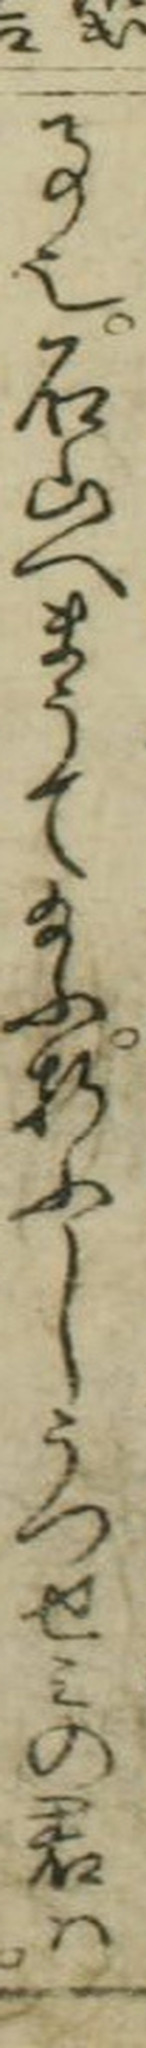事也。石山へまうて給ふ。折ふしうつせみの君は
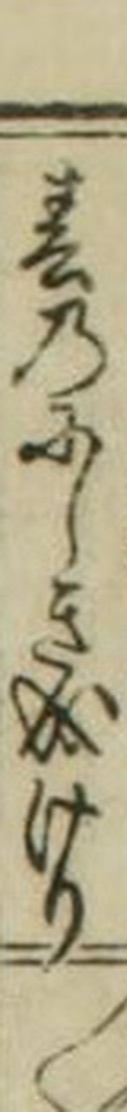春のにしき成けり
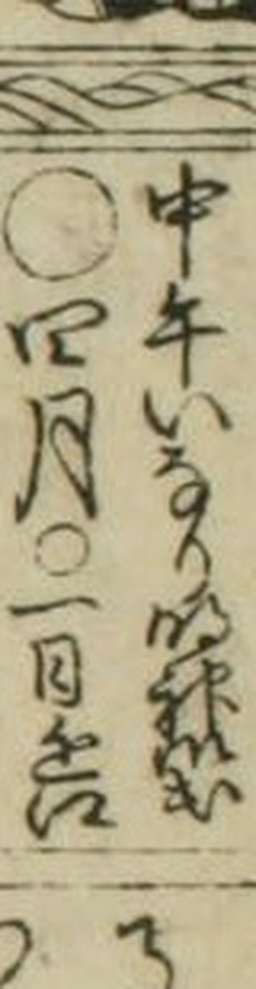○四月○一日近江
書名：女源氏教訓鑑
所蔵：東京学芸大学附属図書館
